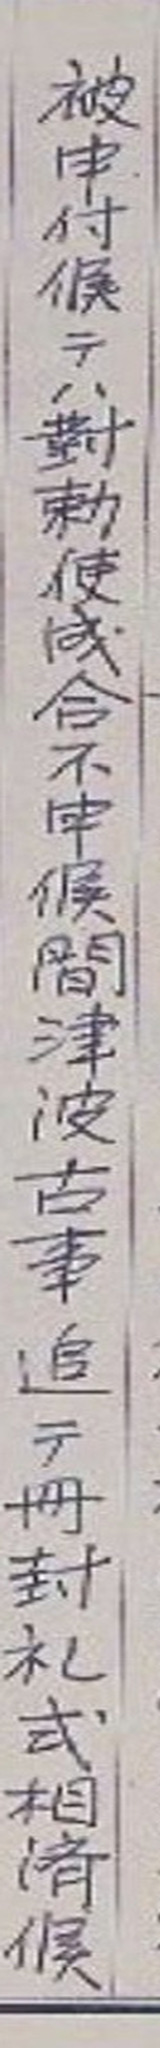被申付候ては対勅使成合不申候間津波古事追て冊封礼式相済候
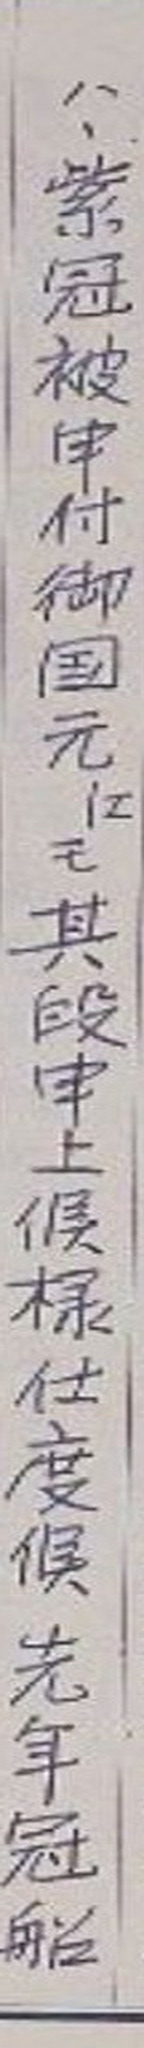はゝ紫冠被申付御国元えも其段申上候様仕度候先年冠船
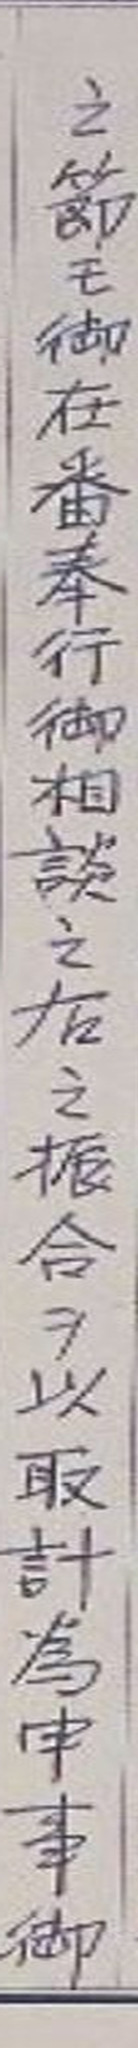之節も御在番奉行御相談之右之振合を以取計為申事御
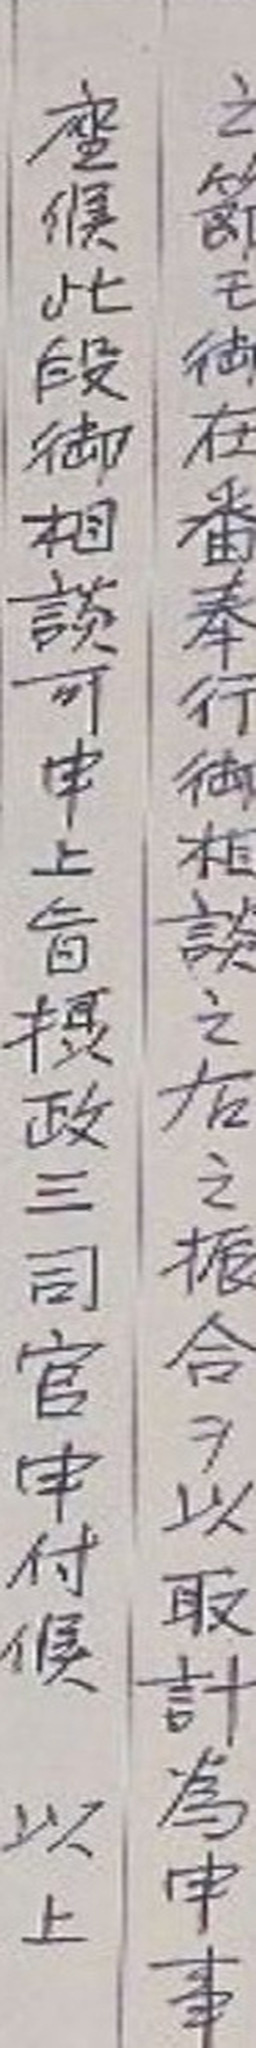座候此段御相談可申上旨摂政三司官申付候以上
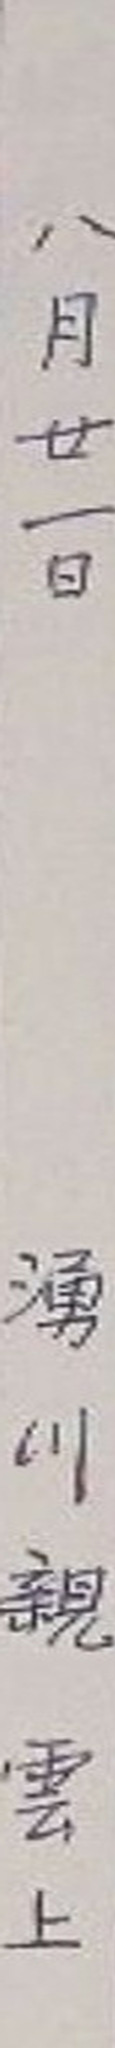八月廿一日湧川親雲上
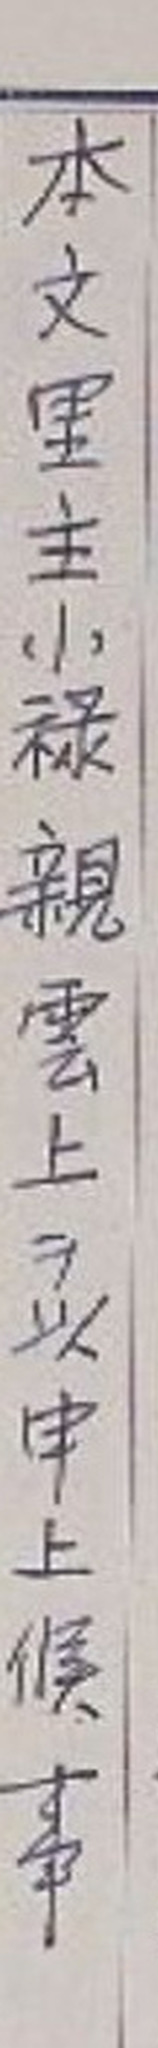本文里主小禄親雲上を以申上候事
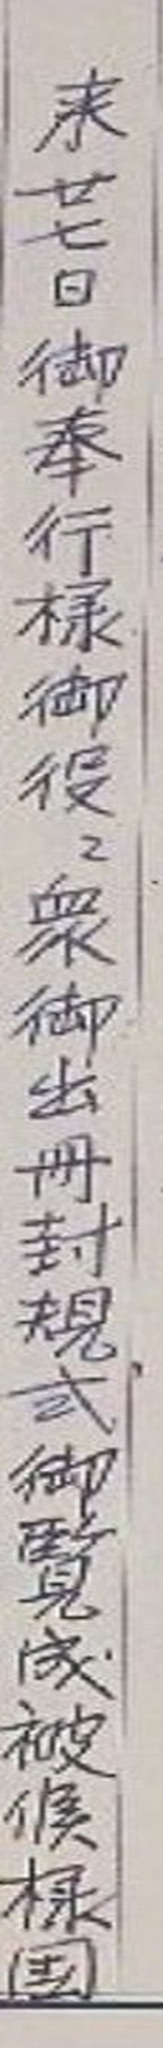来廿七日御奉行様御役々衆御出冊封規式御覧成被候様国
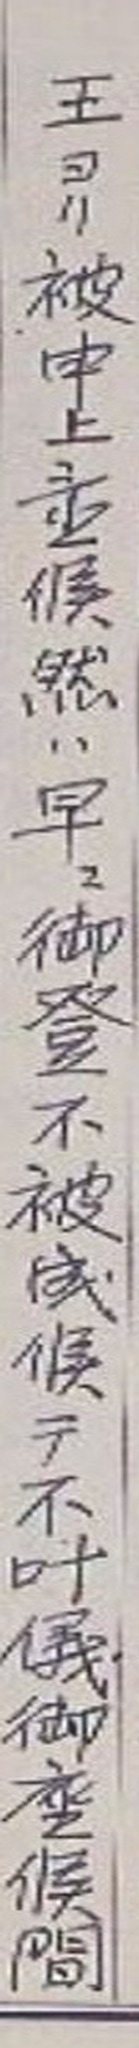王より被申上置候然は早々御登不被成候て不叶儀御座候間
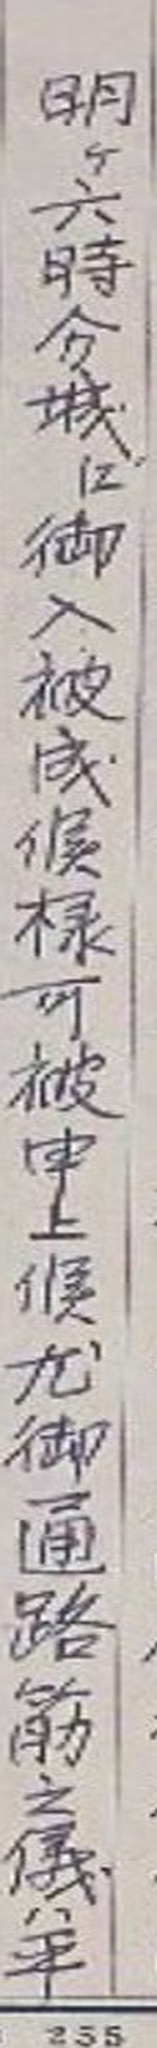明け六時分城え御入被成候様可被申上候尤御通路筋之儀は平
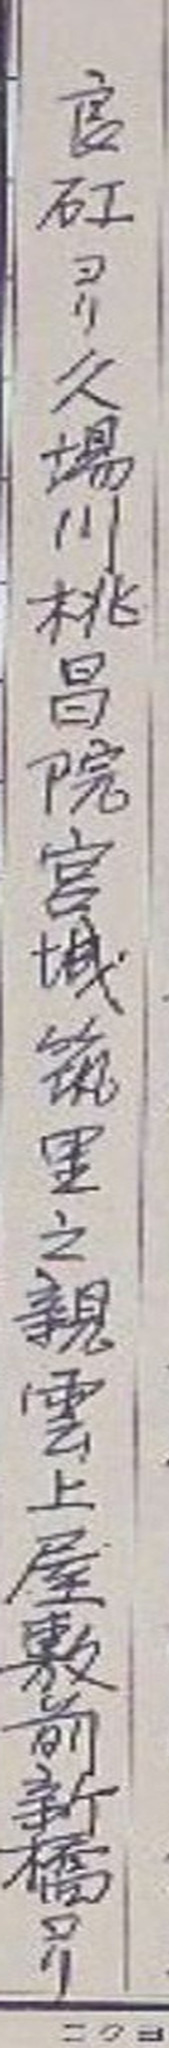良矼より久場川桃昌院宮城筑里之親雲上屋敷前新橋より
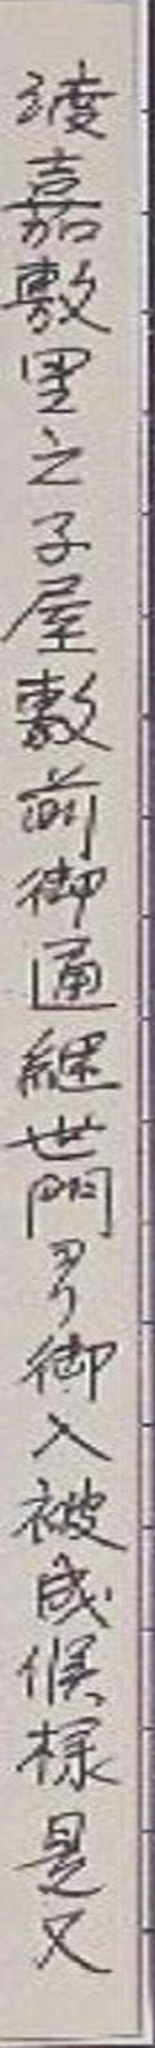渡嘉敷里之子屋敷前御通継世門より御入被成候様是又
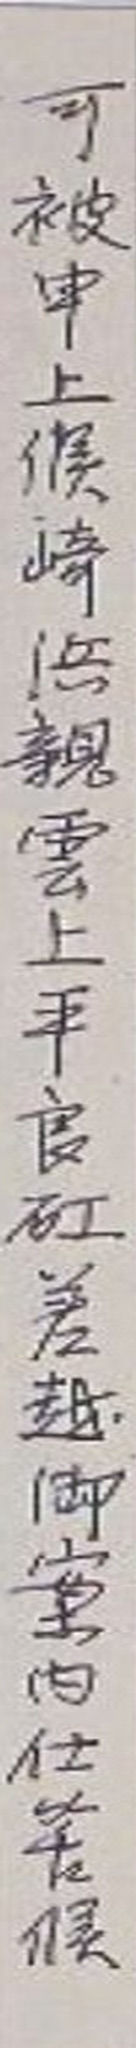可被申上候崎浜親雲上上平良矼差越御案内仕筈候
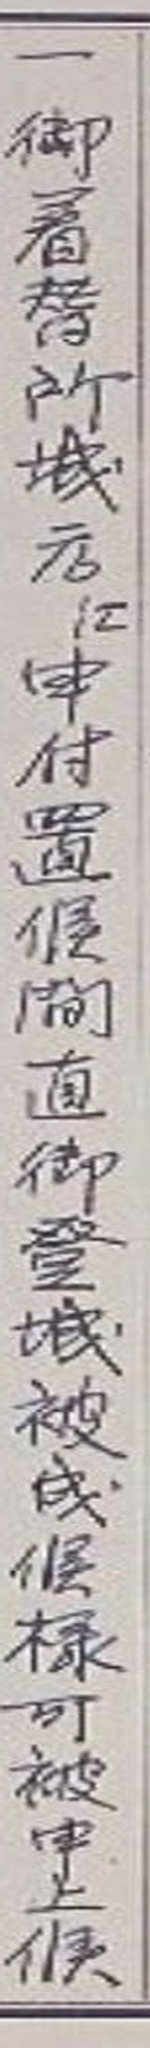一御着替所城店え申付置候間直御登城被成候様可被申上候
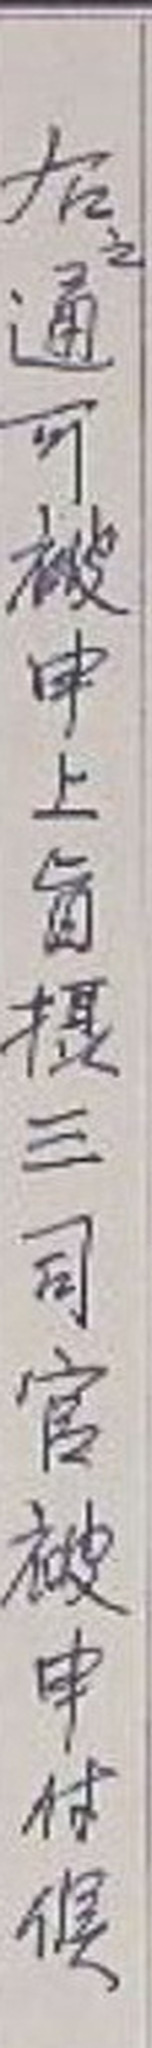右之通可被申上旨摂三司官被申付候
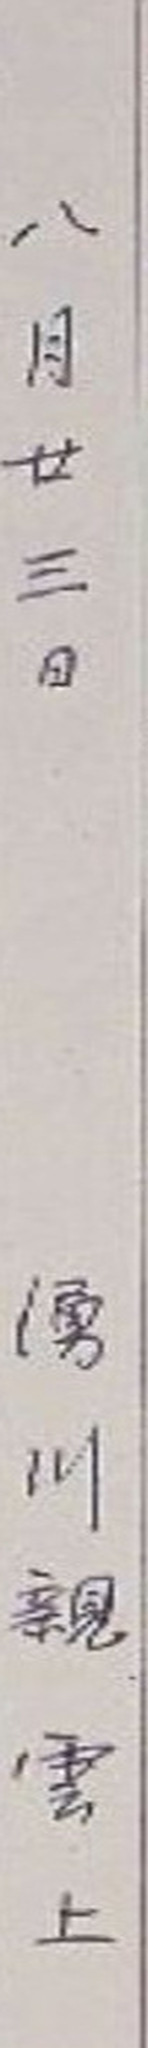八月廿三日湧川親雲上
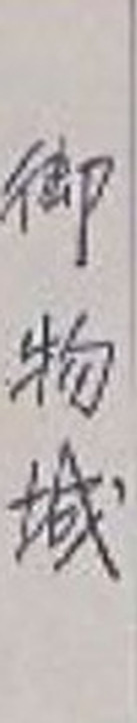御物城
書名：支那冊封使来琉諸記 下巻
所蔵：University of the Ryukyus Library
